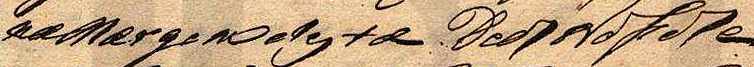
na Margem desta. Deos Nosso se
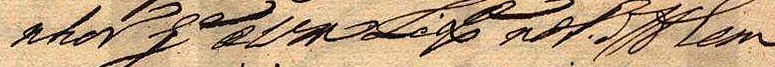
nhor Ge a VM Lixa no s. offo em
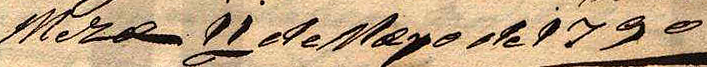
Meza ii de Mayo de i790
